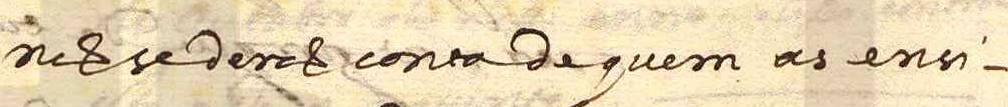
naõ se deraõ conta de quem as ensi
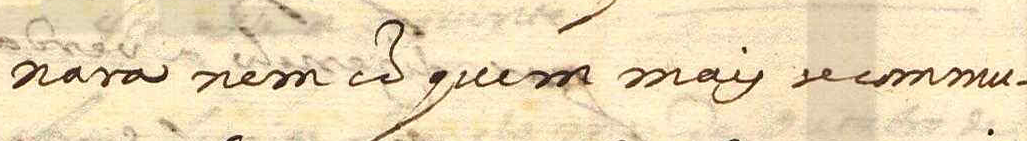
nara nem cō quem mais se commu
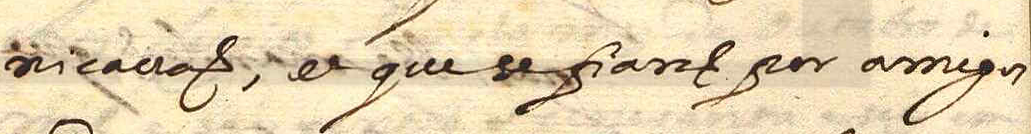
nicauaõ, e que se fiaraõ por amigos
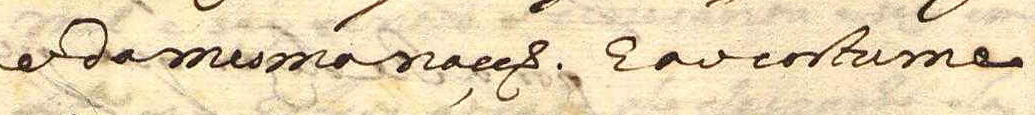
e da mesma naçaõ. E ao costume
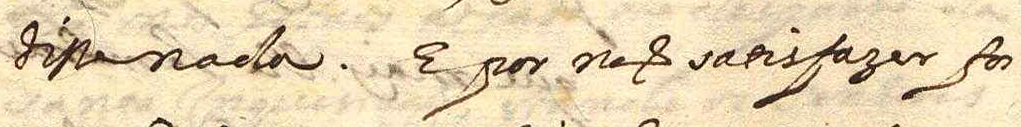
disse nada. E por naõ satisfazer foi
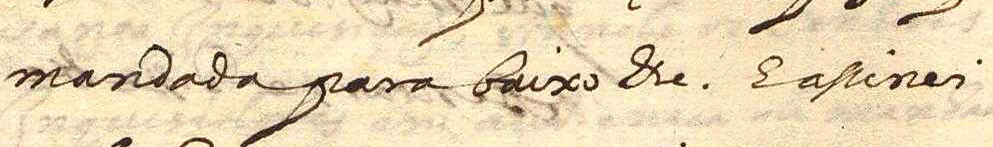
mandada para baixo &c. E assinei
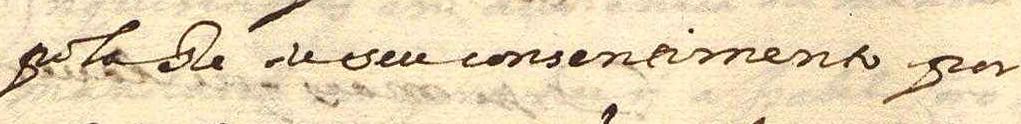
pola Re de seu consentimento por
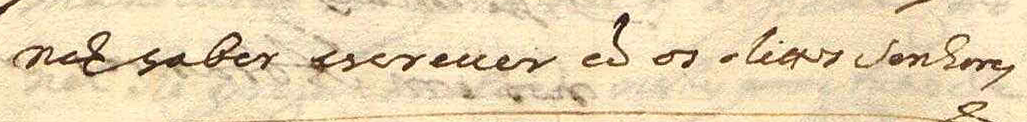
naõ saber escreuer cō os dittos Senhores
